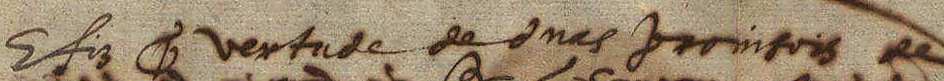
E fiz p̄o vertude de duas prouisois de
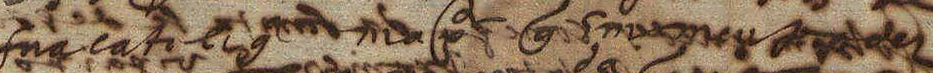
sua catoliqa magte q̄ em meu poder
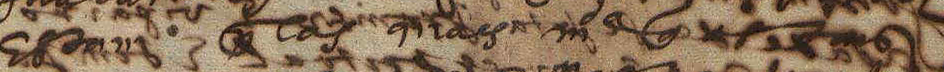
Estam p̄las quaes mda q̄ as tas
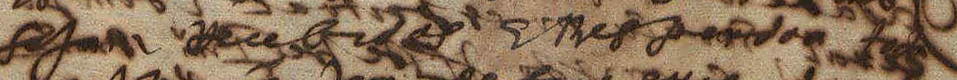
sejam Recebidas E Respondam toda
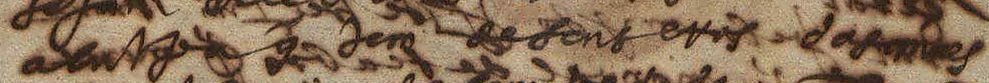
a culpa q̄ tem de seus eRos das maes
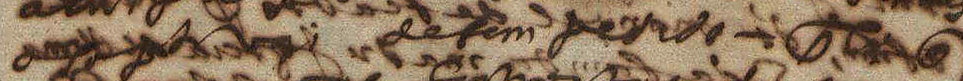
o sopte vai desempedido - p̄lo q̄
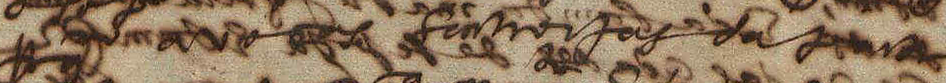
Reqro a vosas senhorJas da parte
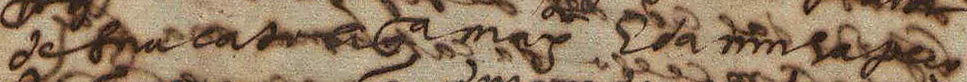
de sua catoliqa magte E da mnha peço
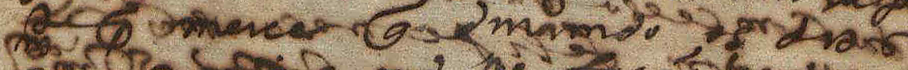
mto p̄ merce q̄ ēuiando os ditos
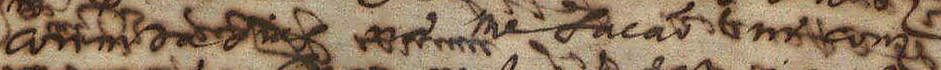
coremta dias nā me façaõ nē com
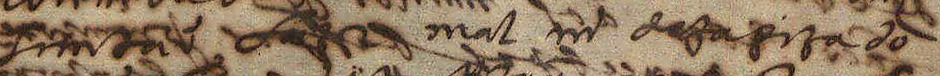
simtaõ fazer mal nē desagizado
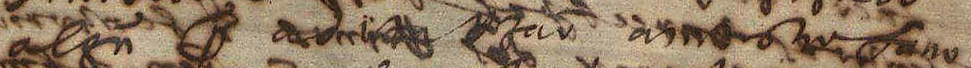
algū p̄ a dita Rezaõ a mais ho fauo
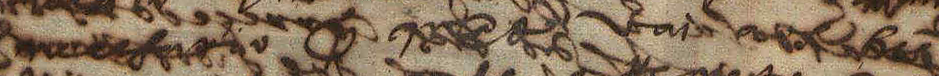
necesario p̄ quāto vai aos sors̄
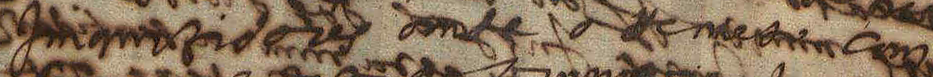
Jmquizidores omde o Remeto com
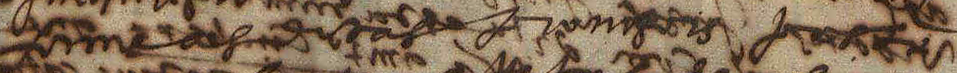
forme as ditas de prouisois p_
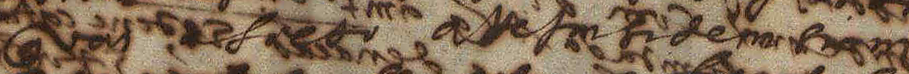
q̄ vai o facto a ReJmsidemsia _m
